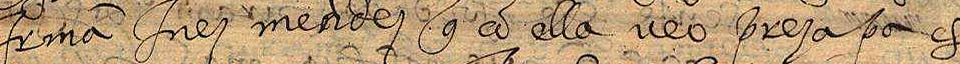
Jrmã Jnez mendez q̄ cō ella ueo preza pa es
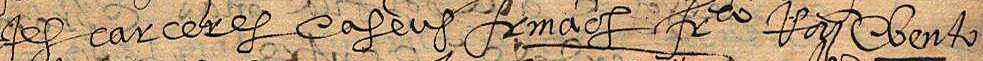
tes carceres e a seus Jrmaõs frco Roiz̄ e bento
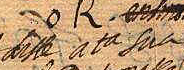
disse a ta sua
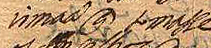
irmaã q̄ tomasse
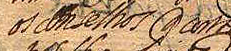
os conselhos q̄ certa
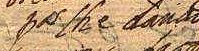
pas lhe dando
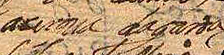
acerqua da garda
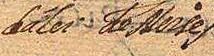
da lei de Moises
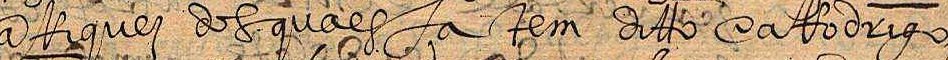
āRiquez dos quaes Ja tem ditto e a Rodrigo
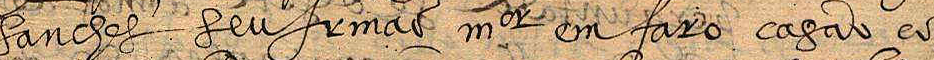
sanches seu Jrmaõ mor em faro casado cō
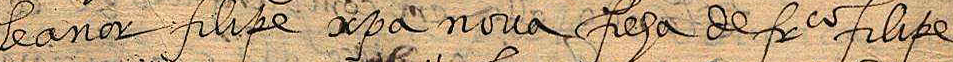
leanor filipe xpā noua filha de frco filipe
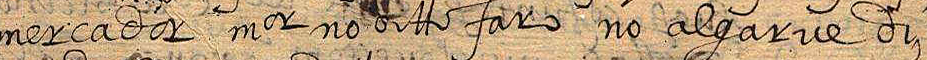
mercador mor no ditto faro no algarue di
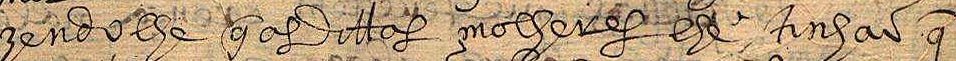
zendolhe q̄ as dittas molheres lhe tinhaõ q̄
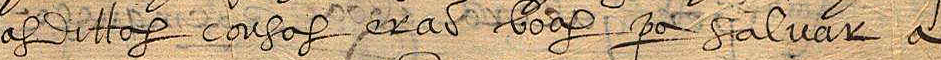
as dittas cousas eraõ boas ꝑa saluar a
